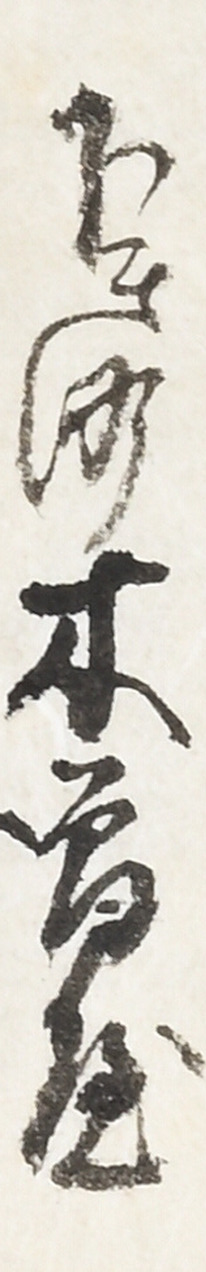下モ町木曽屋
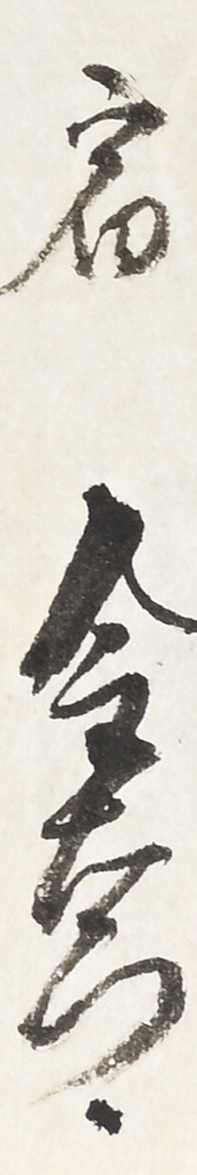宿金右衛門
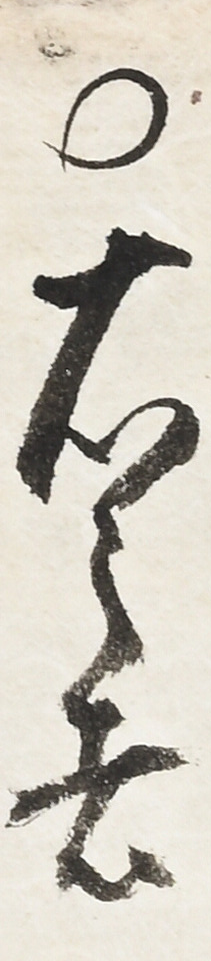〇右之者
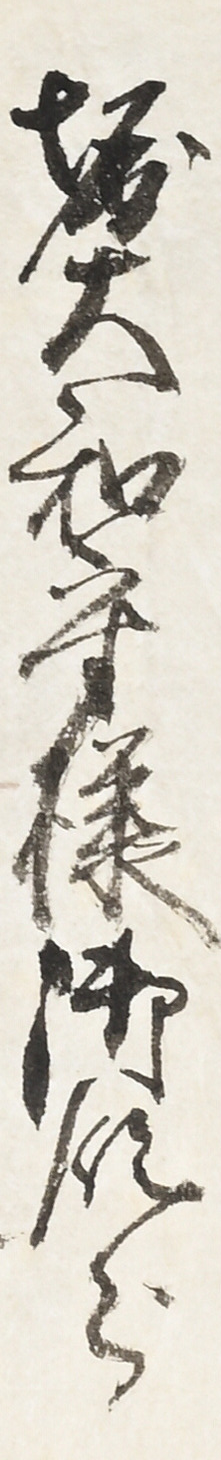堀大和守様御領分
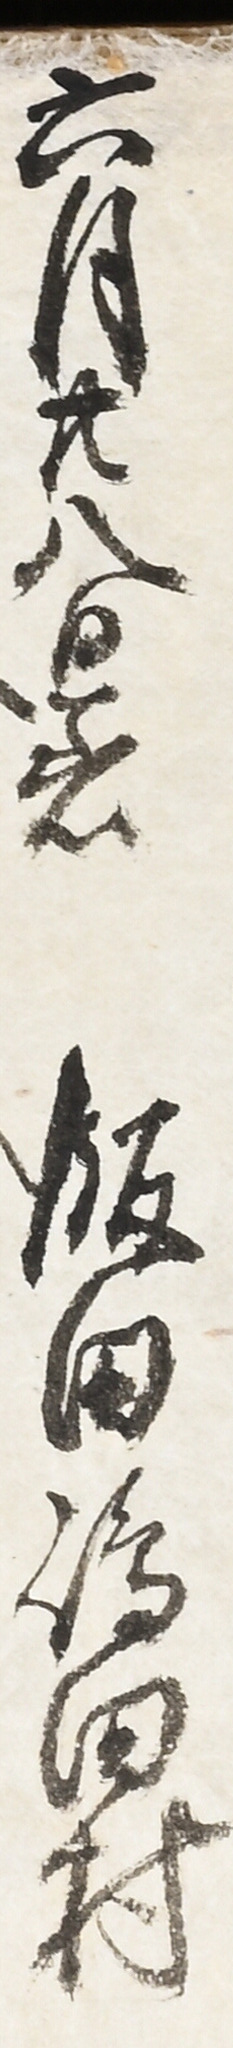六月廿八日着飯田嶋田村
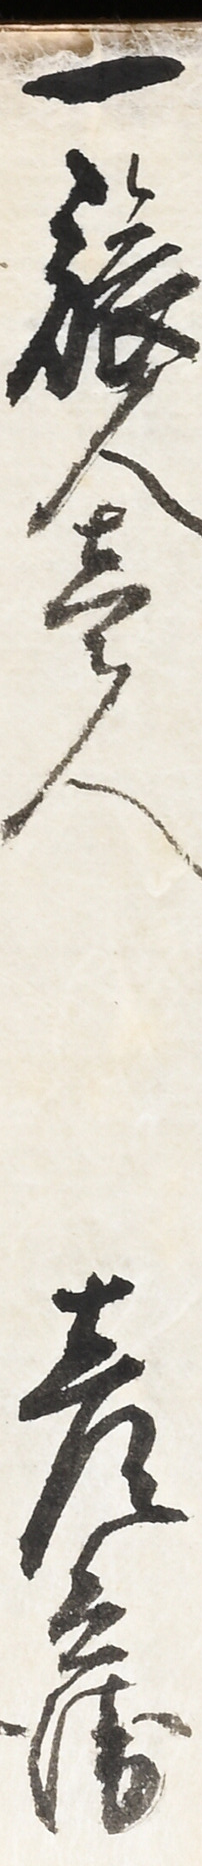一旅人壱人彦兵衛
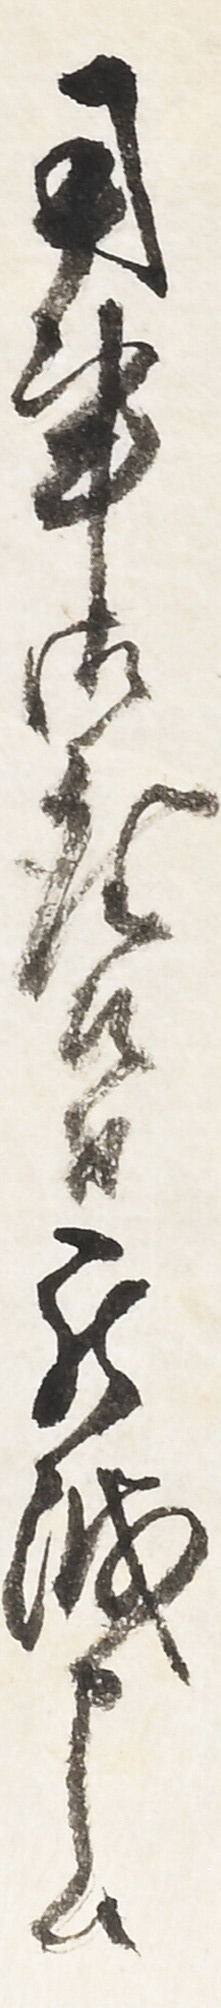用事御座候付罷越申候
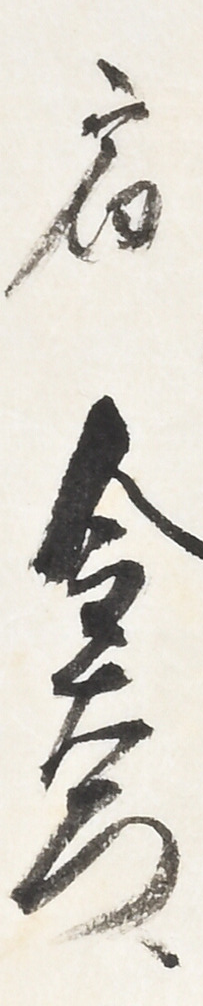宿金右衛門
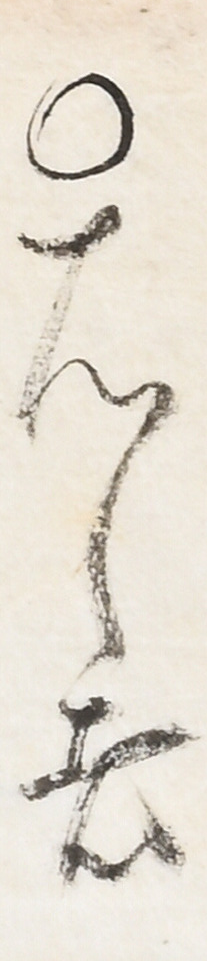〇右之者
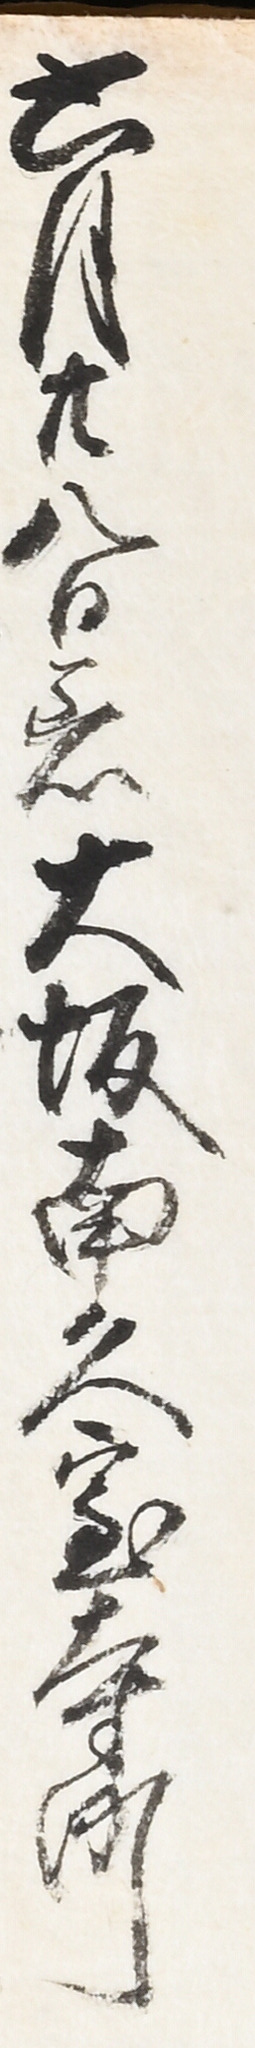六月廿八日着大坂南久宝寺町
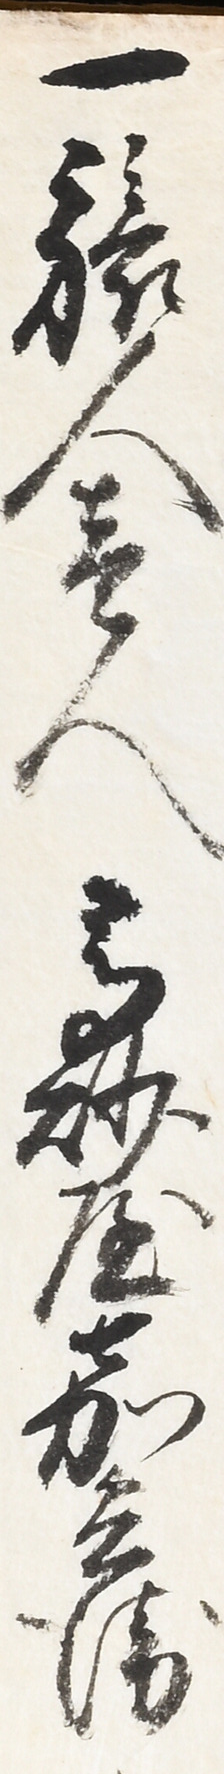一旅人壱人高砂屋嘉兵衛・
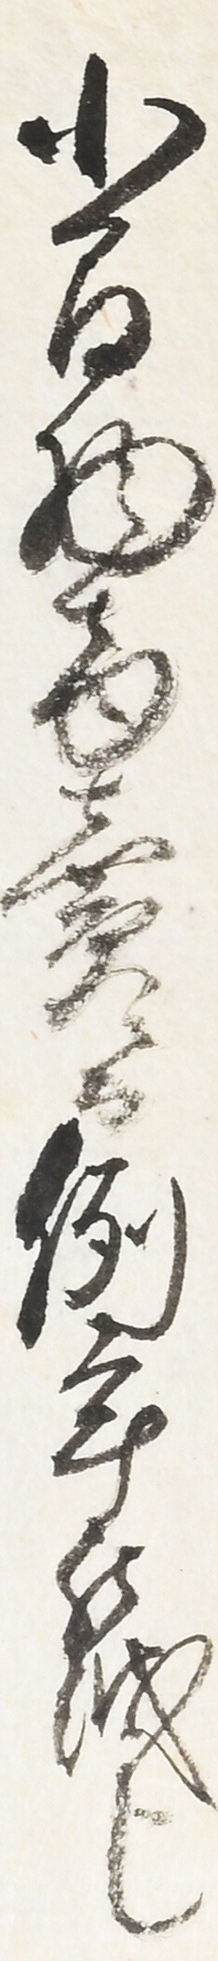小間物商売ニ而例年罷越申候
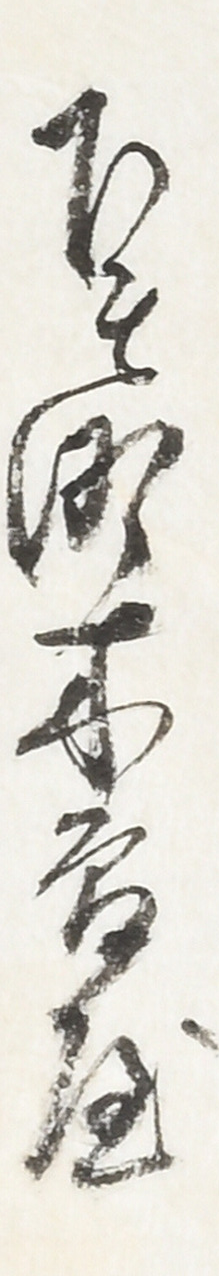下モ町木曽屋
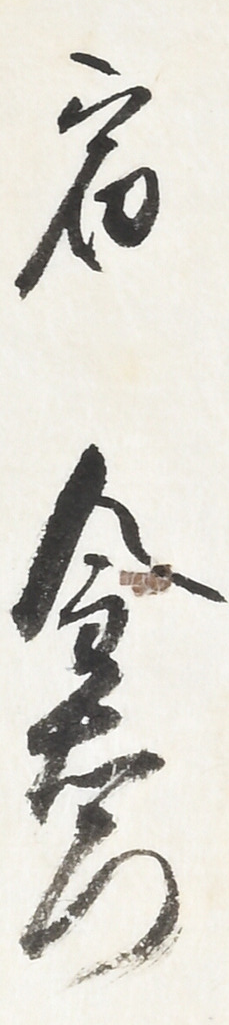宿金右衛門

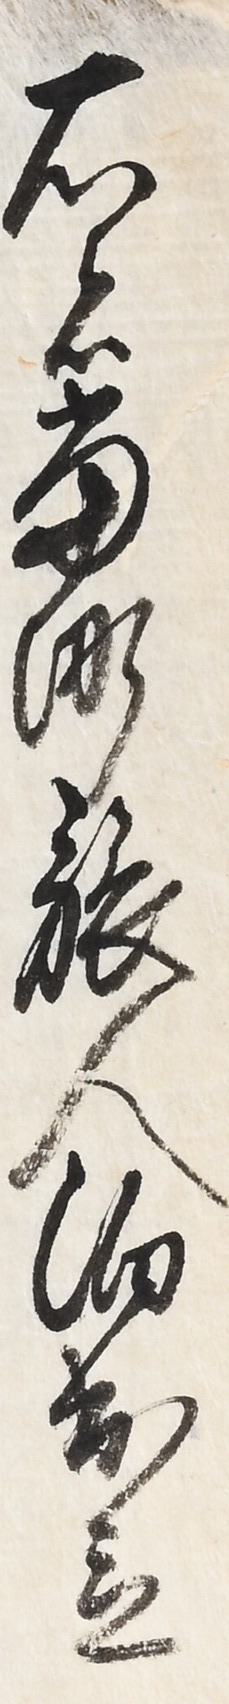右者当町旅人泊出立
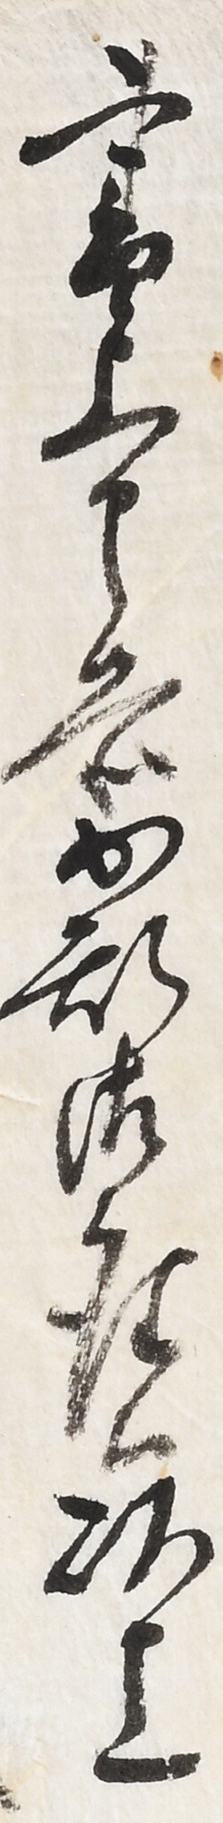書上申所如斯御座候以上
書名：旅人泊控帳
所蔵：伊那市立高遠町図書館・合同会社AMANE
